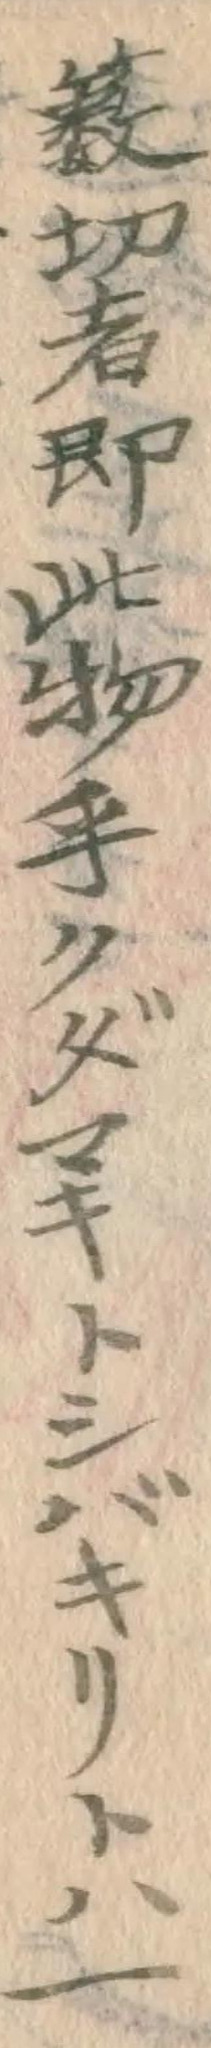籔切者即此物乎クダマキトシバキリトハ一
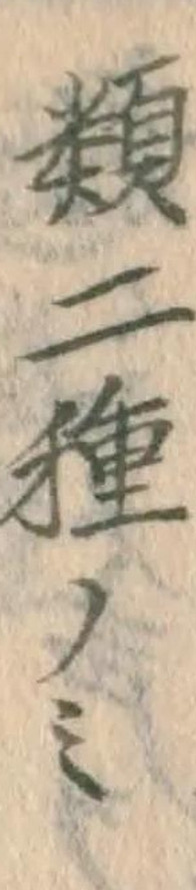類二種ノミ
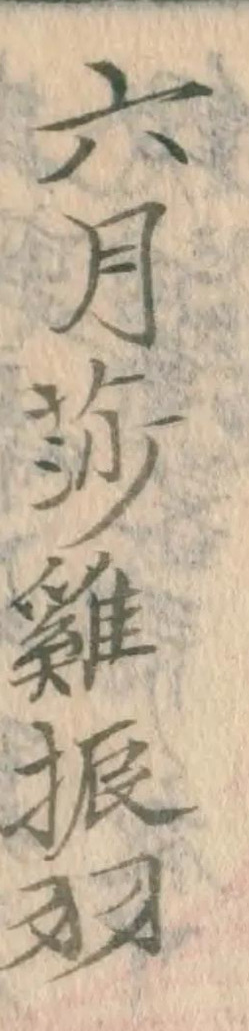六月莎鶏振羽

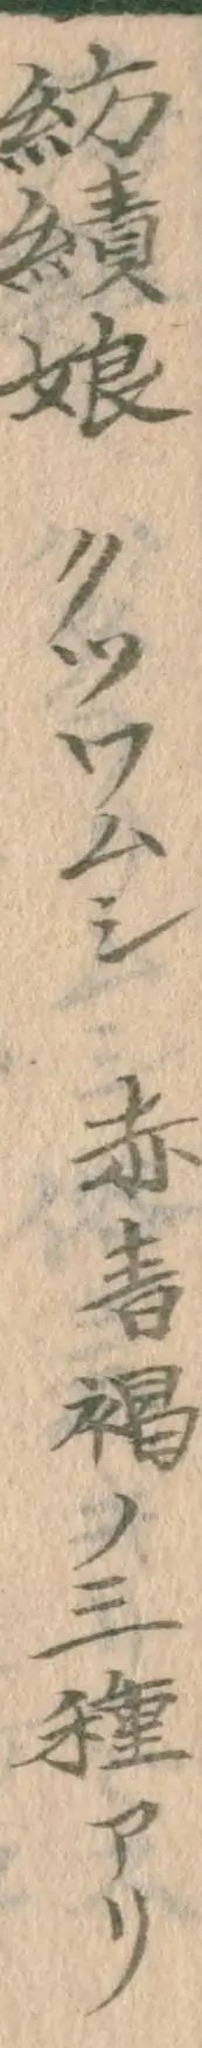紡績娘クツワムシ赤青褐ノ三種アリ
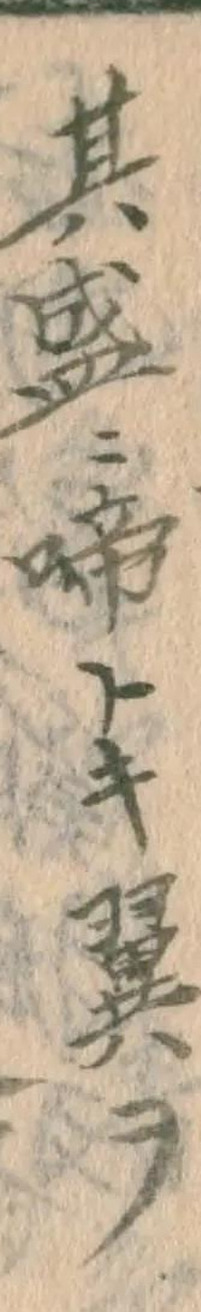其盛ニ啼トキ翼ヲ
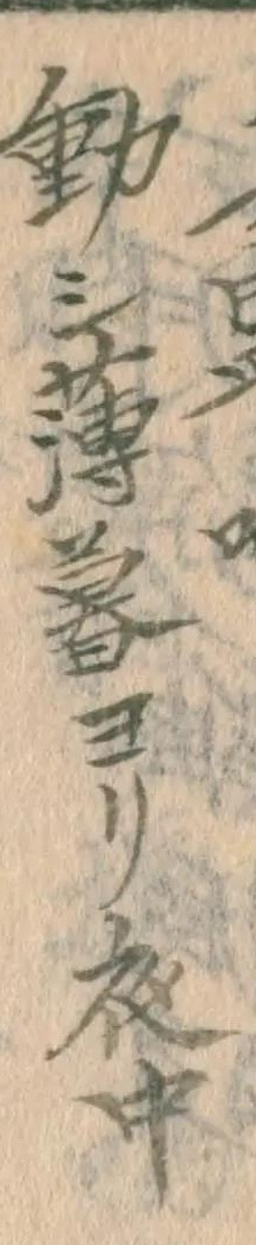動シ薄暮ヨリ夜中
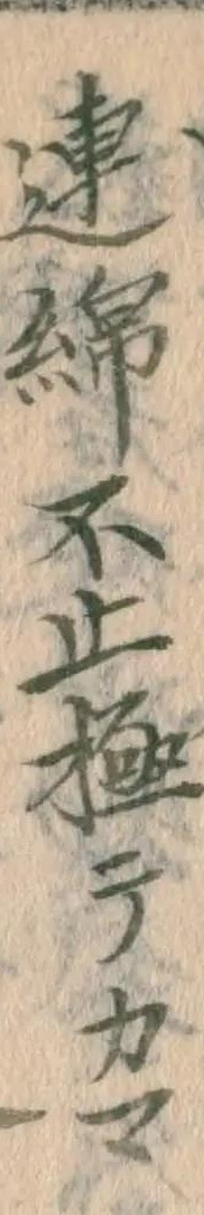連綿不止極テカマ
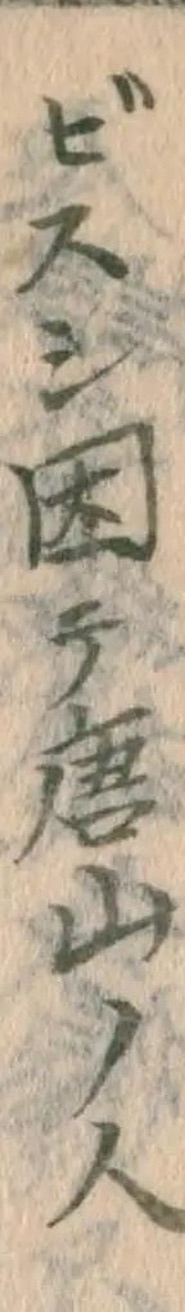ビスシ因テ唐山ノ人
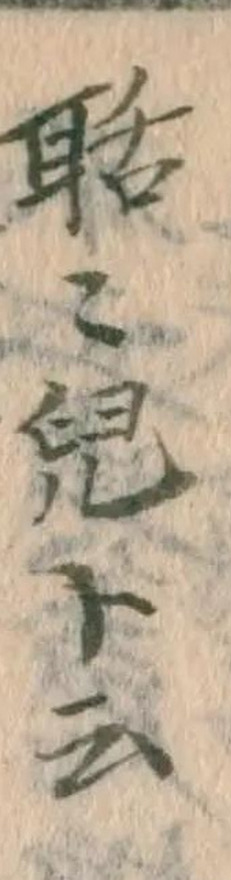聒々兒ト云
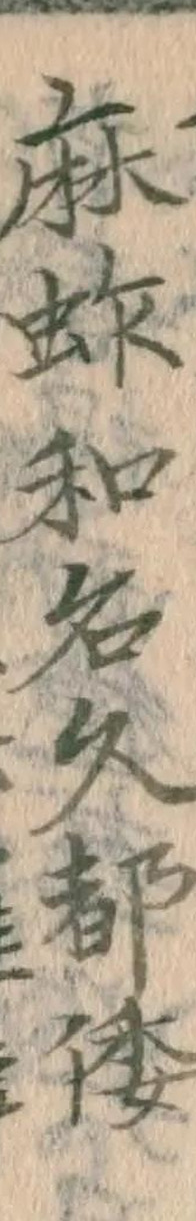麻蚱和名久都倭
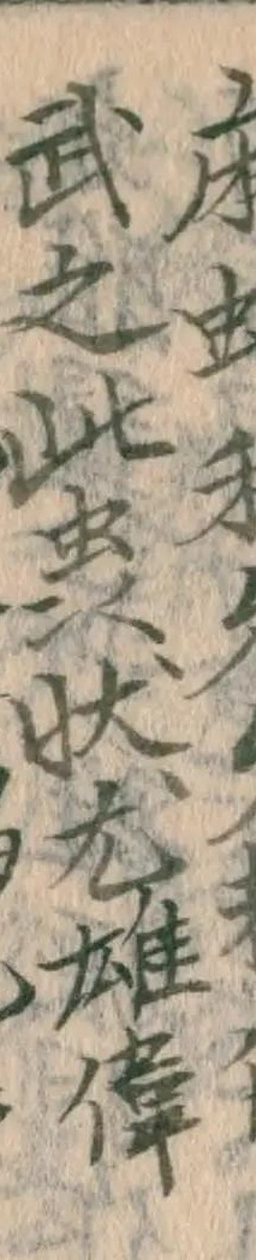武之此蟲状尤雄偉
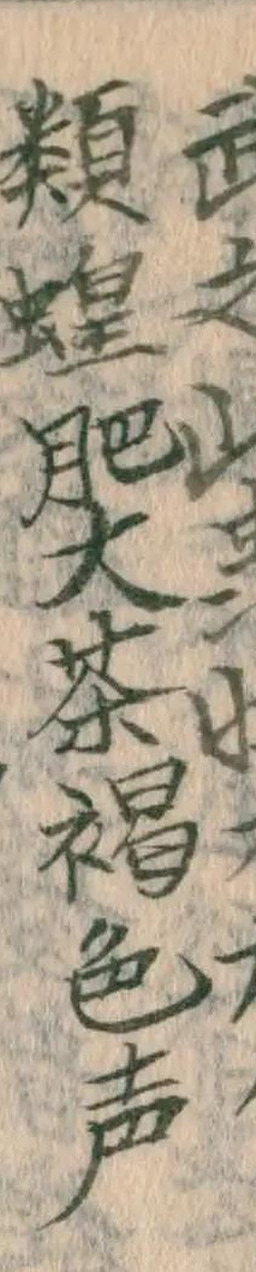類蝗肥大茶褐色声
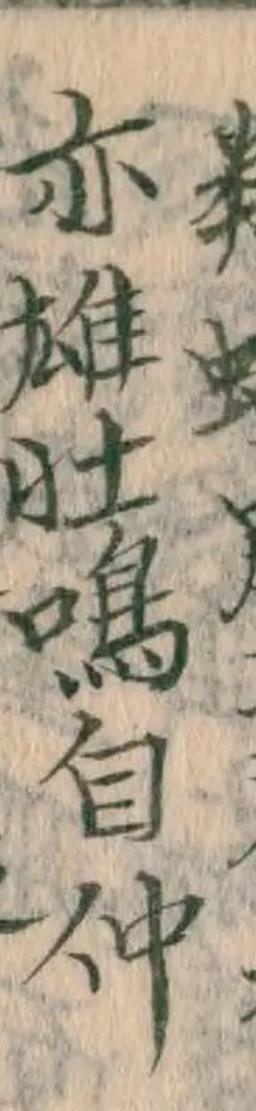亦雄壮鳴自仲
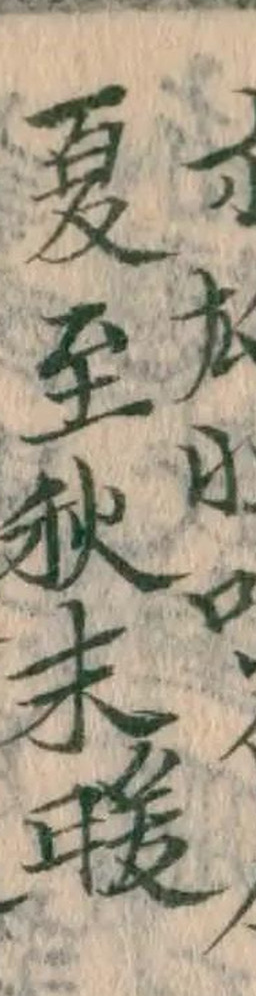夏至秋末暖
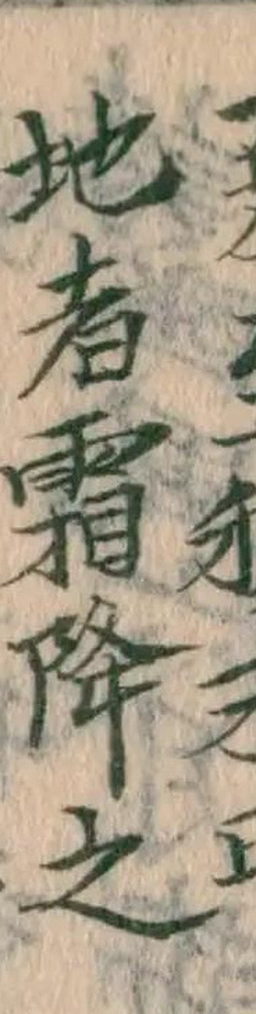地者霜降之
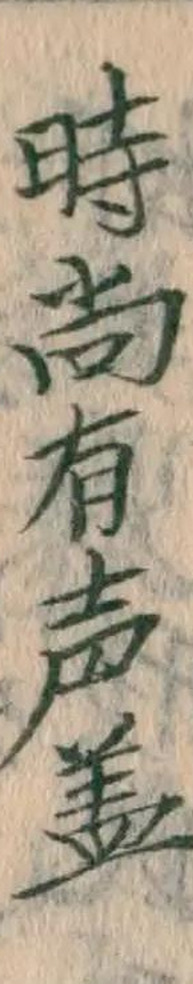時尚有声蓋
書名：千蟲譜 3巻. [3]
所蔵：国立国会図書館 National Diet Library, JAPAN
